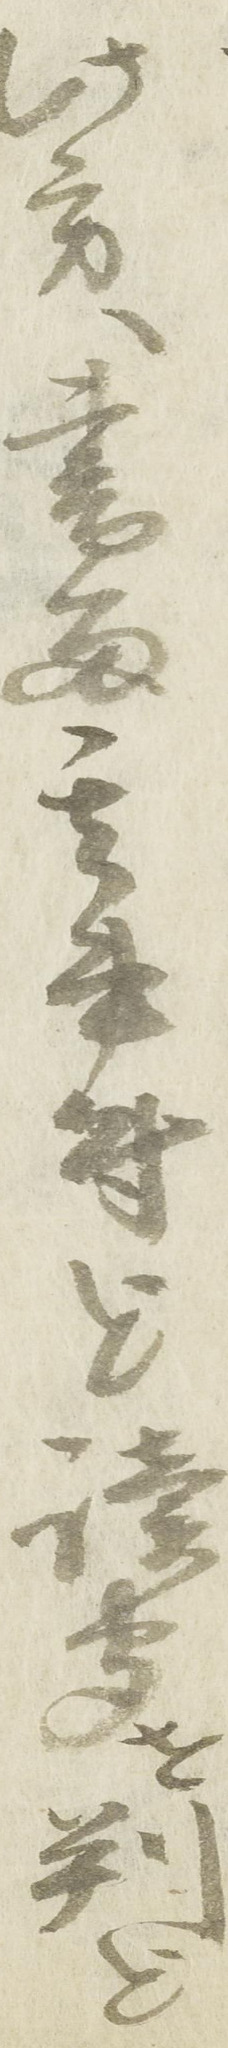此方へ書留其書付を読聞を判を
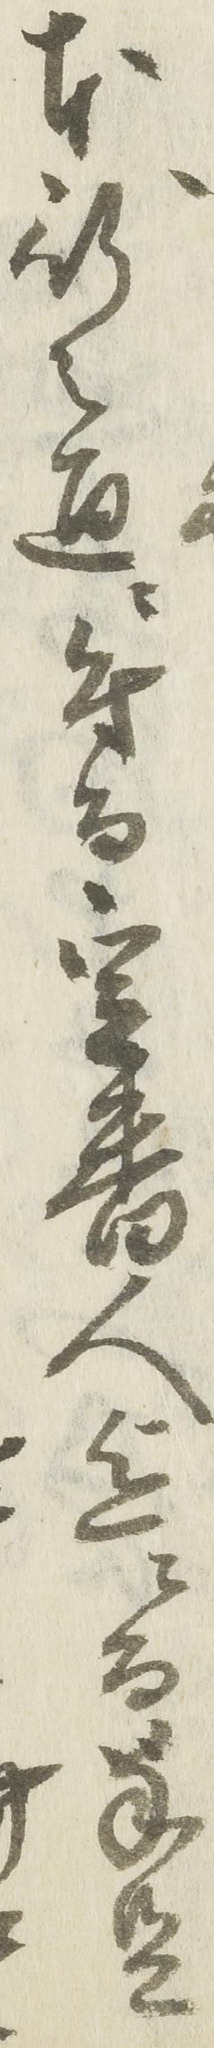本行の通ニ付而定番人迄ニ而手足
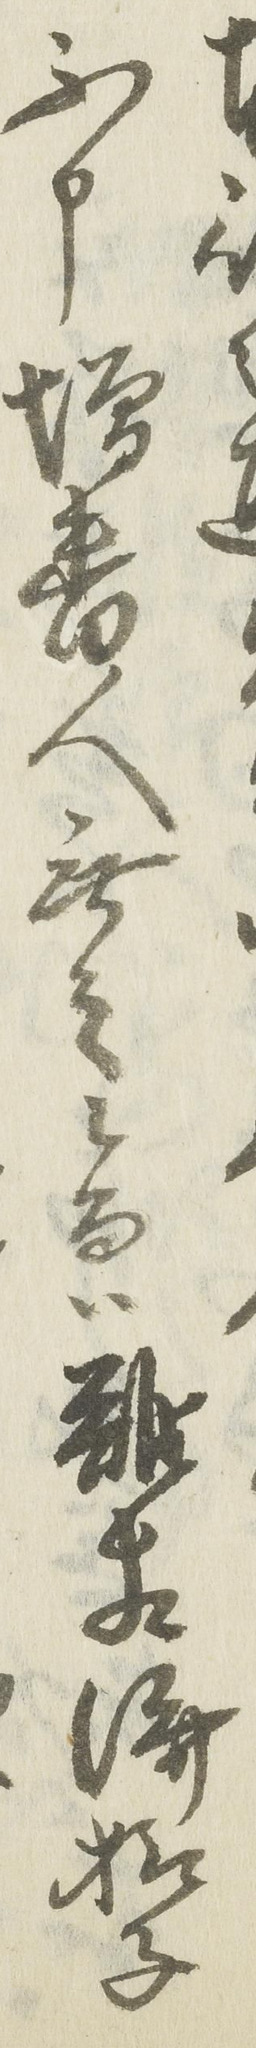不申増番人無之候而は難相済様子
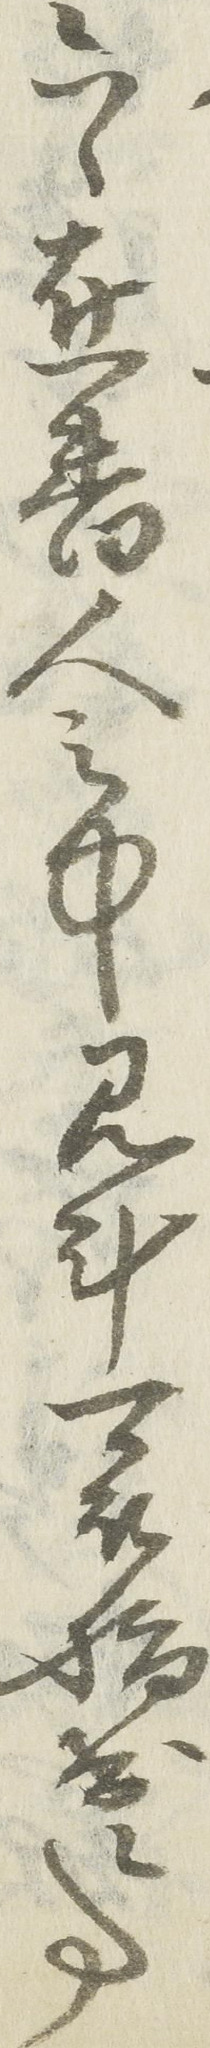候はゝ在番人之中見計可被指出候事
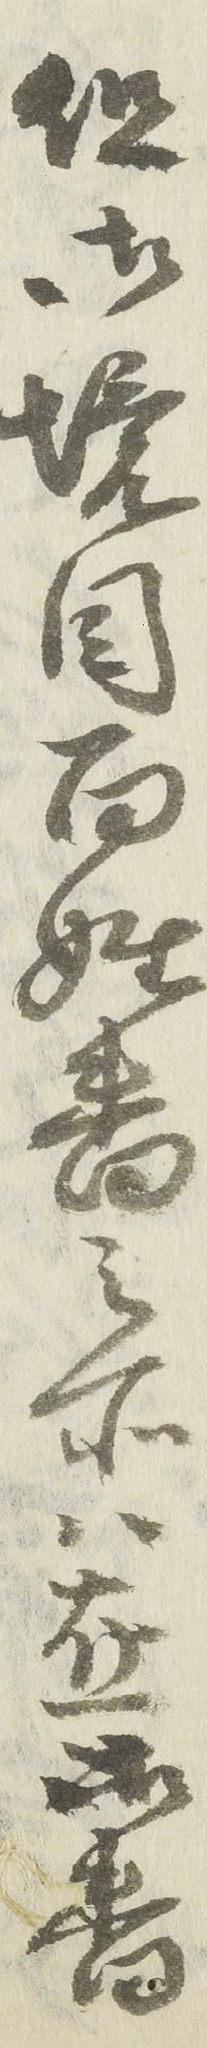但御境目百姓番之所は在御番
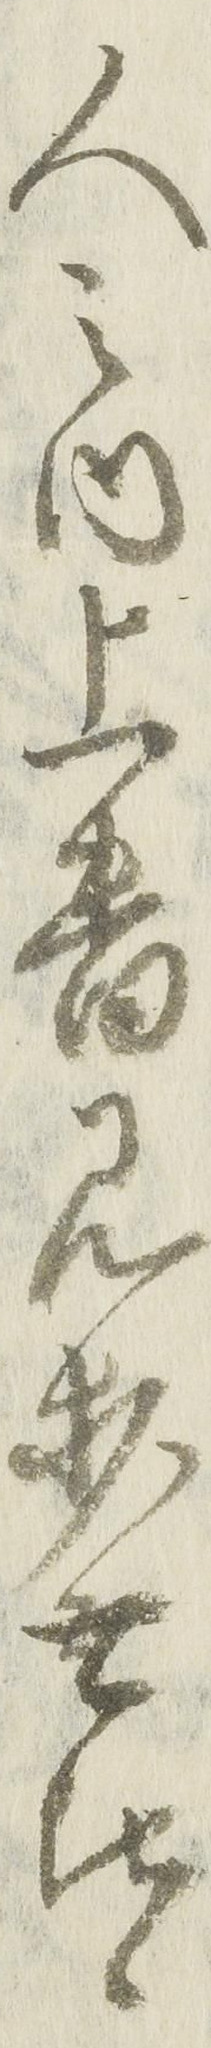人之内上番見扑可仕候
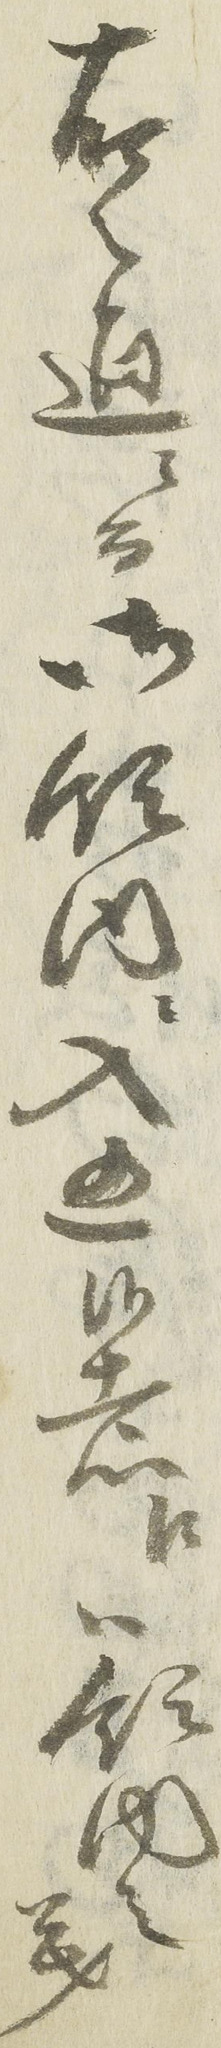右之通ニ而御領内ニ入込候者江は領内之義

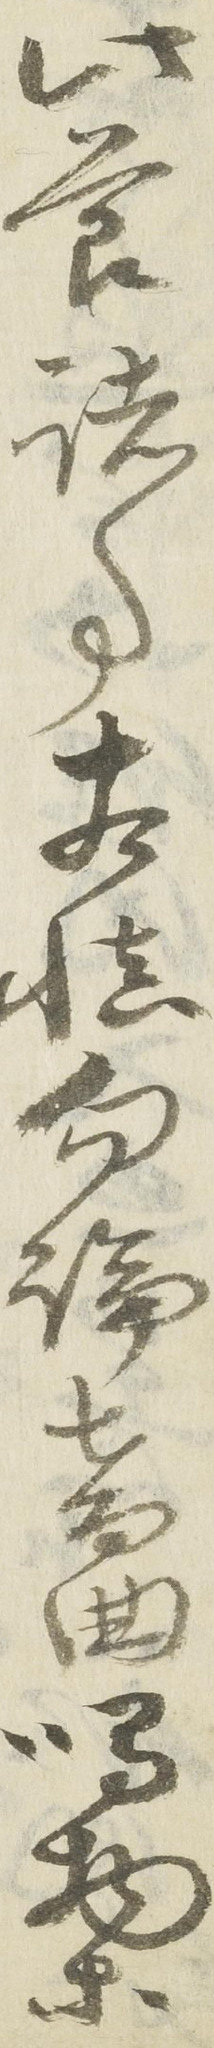此節諸事相慎勿論音曲鳴物等
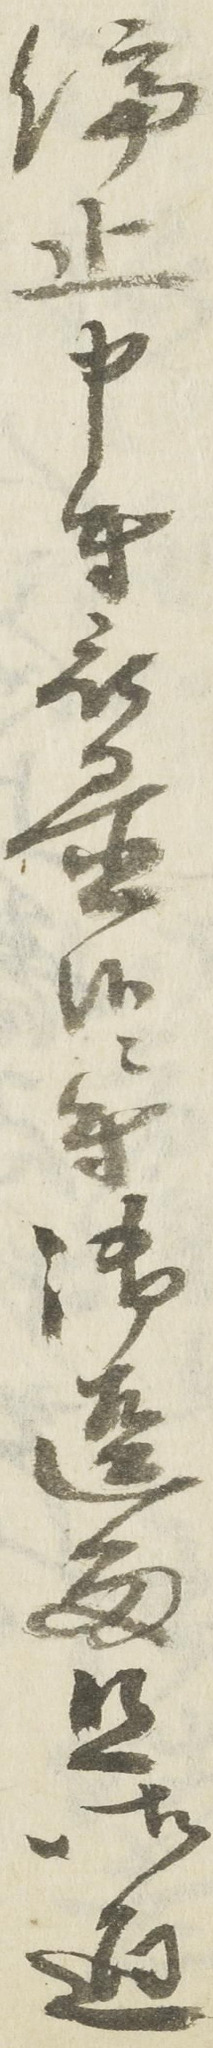停止申付被置候ニ付御違留且御通
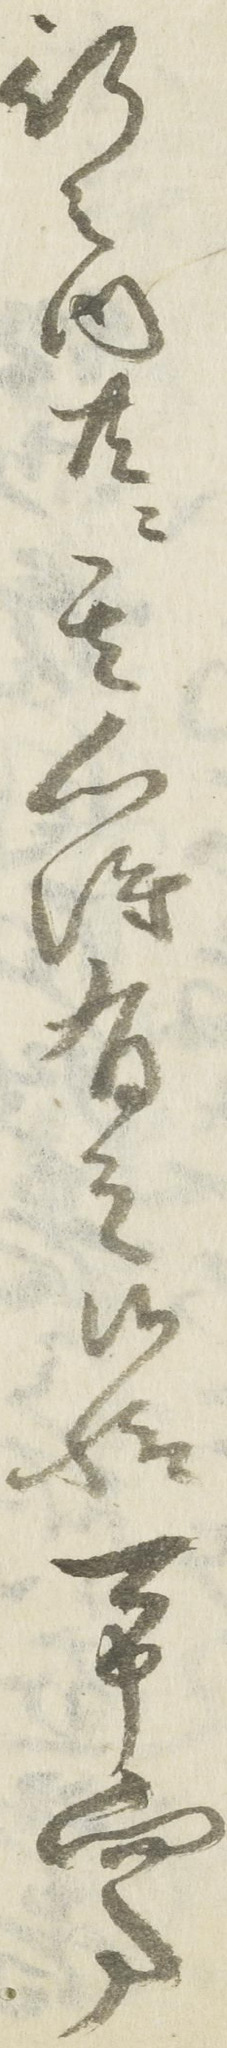行之内共ニ其心得有之候様可申向事
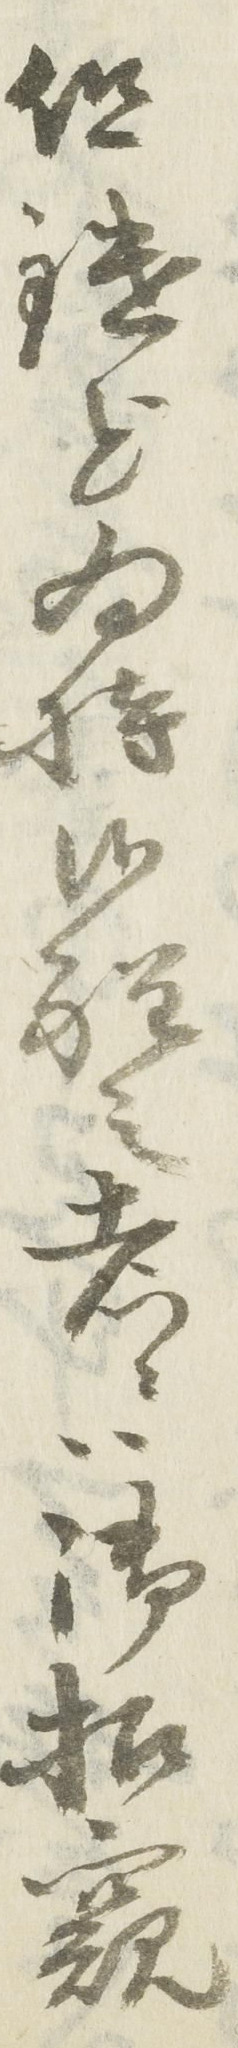但銭を為持候程之者ニは御招窺
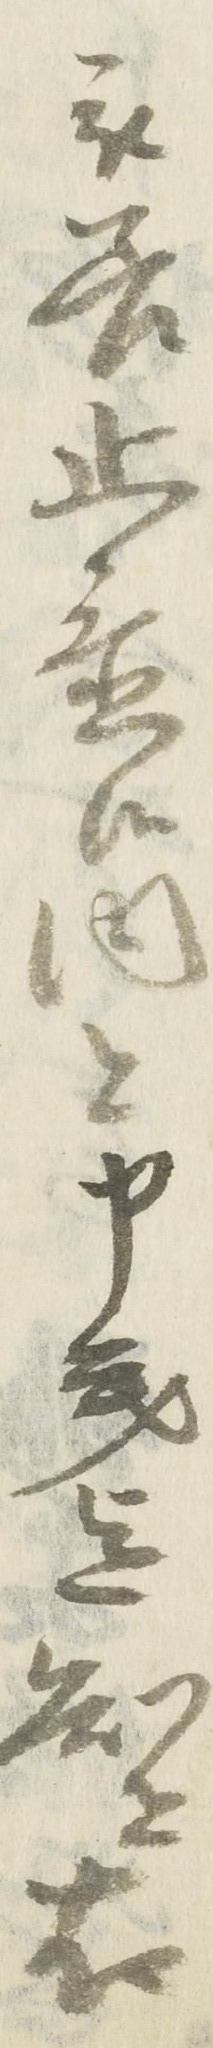被差止置候内と申義迄知を右
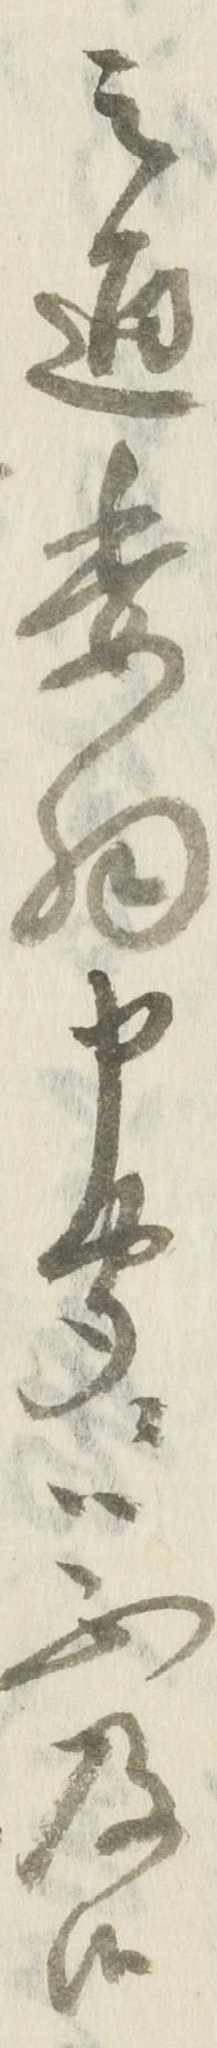之通委細申聞ニは不及候
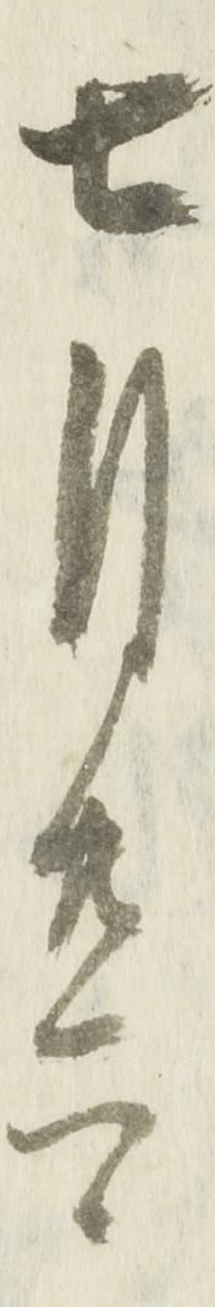七月廿二日
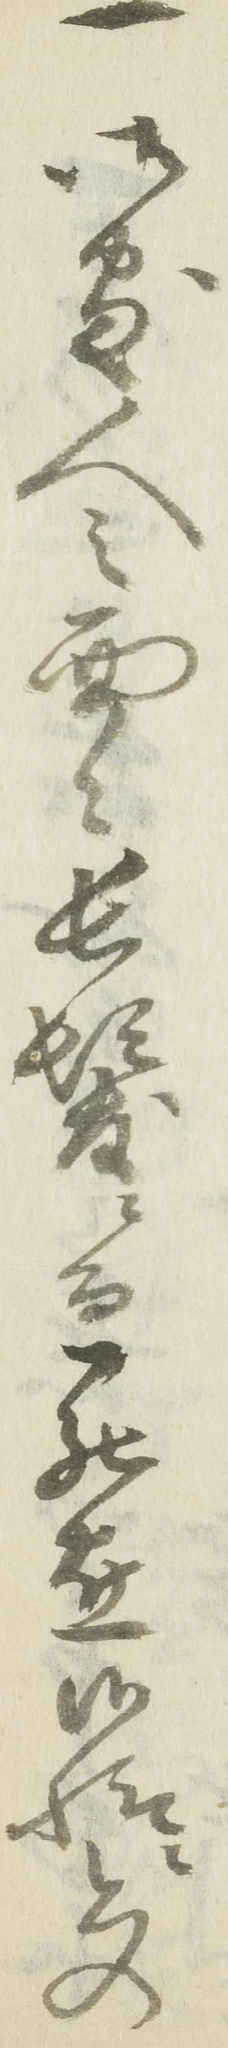一御家人之面々長髪ニ而罷在候様ニとの
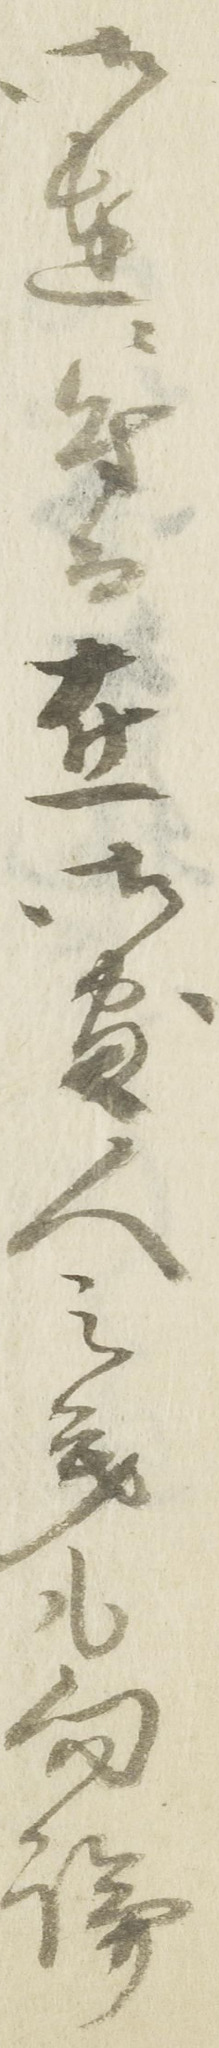御達ニ付而在御家人之義も勿論
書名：後見笑
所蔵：東京大学地震研究所図書室 Earthquake Research Institute Library, The University of Tokyo, JAPAN
